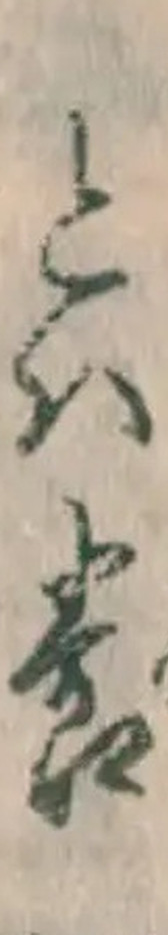とは養
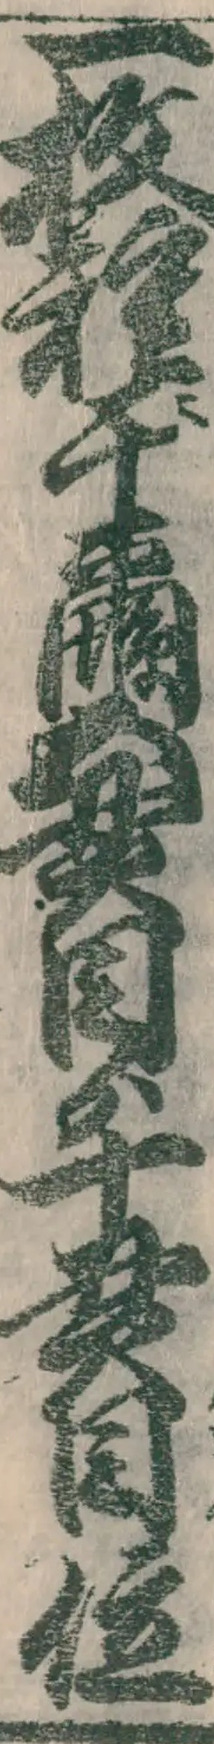一枚種に干繭五貫目ゟ十貫目位
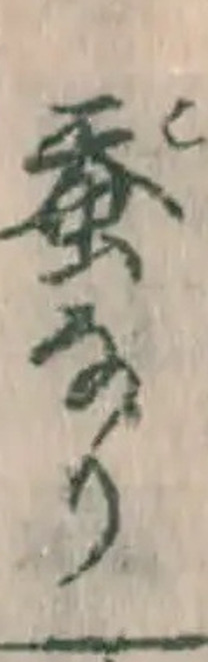蚕なり
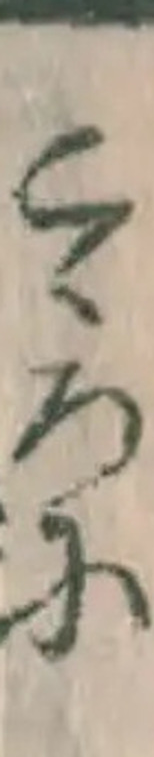こゝろに
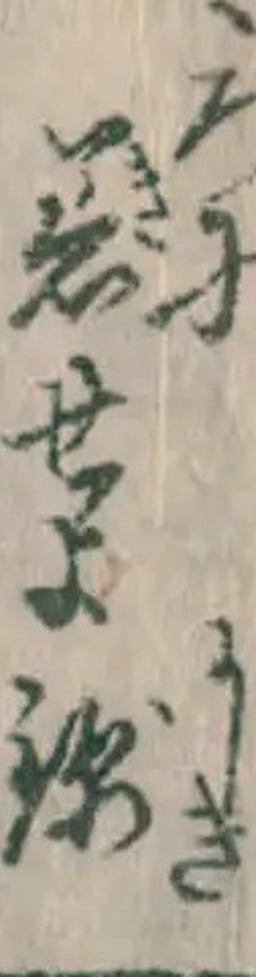着せよ錦
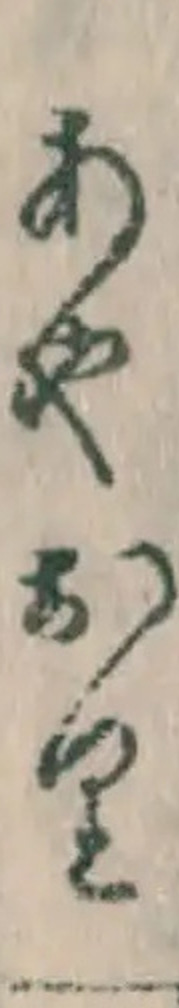あやおり
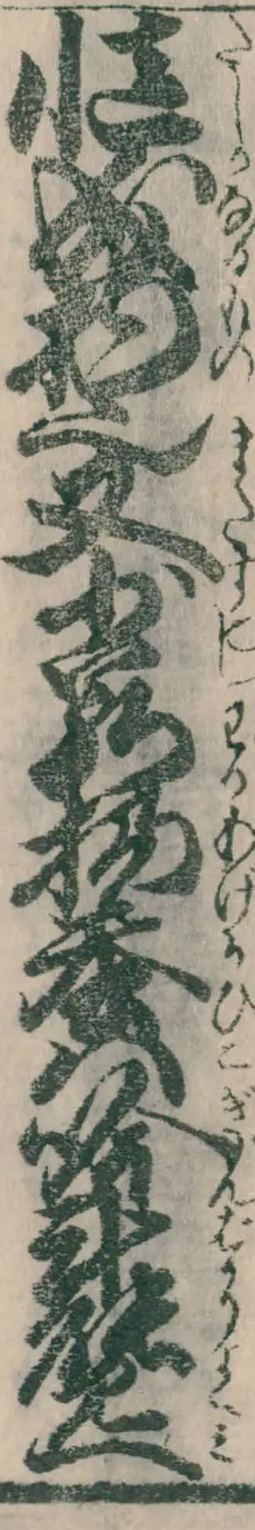慥成物也又少若揚蚕は吟斗能見へ

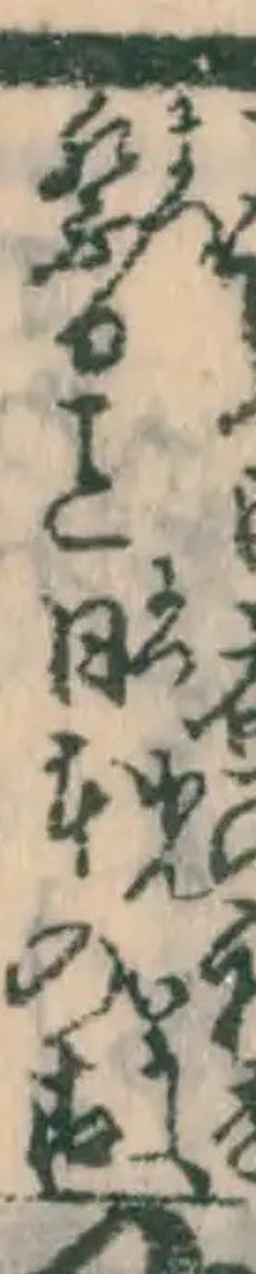祭ること日本の古
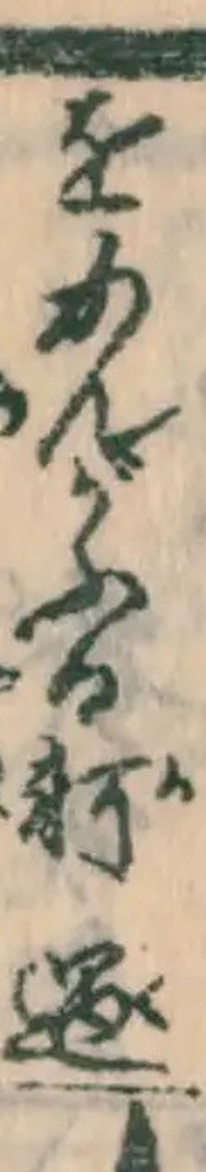をかんがふる軻遇
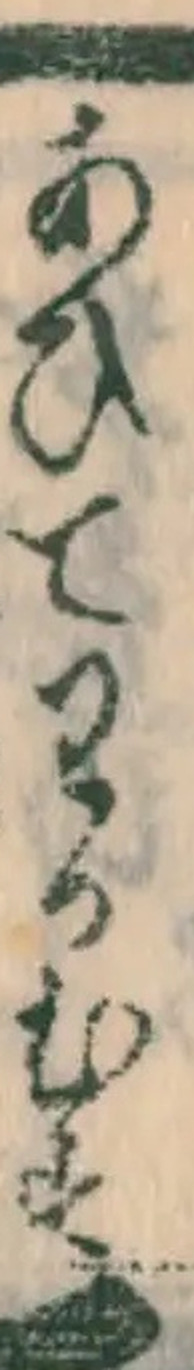あひてわかむす
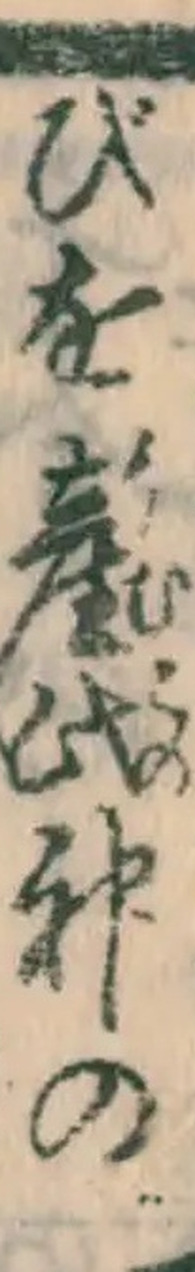びを産此神の
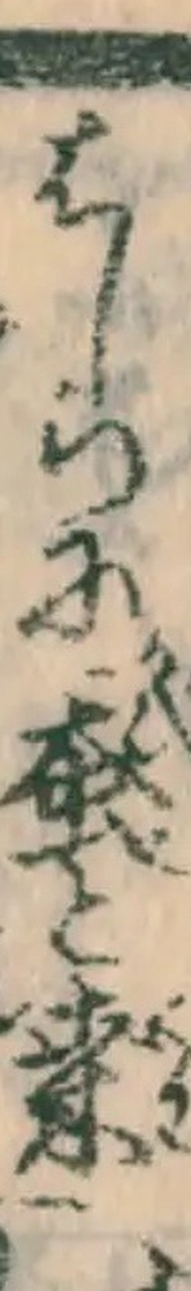はしらに蚕を桑
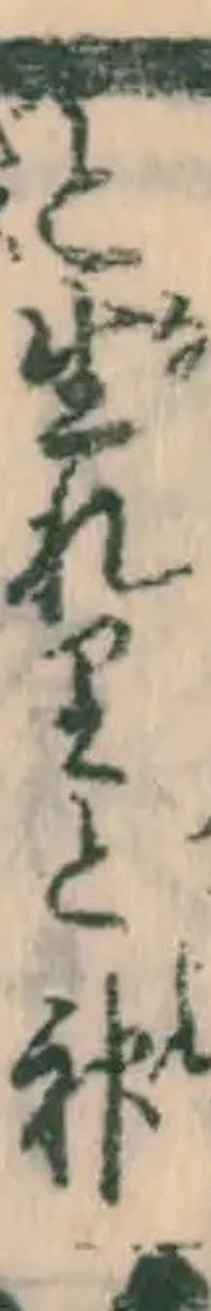と生れりと神
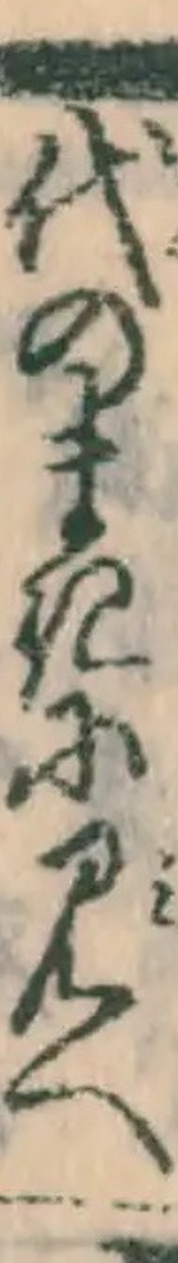代のまきに見へ
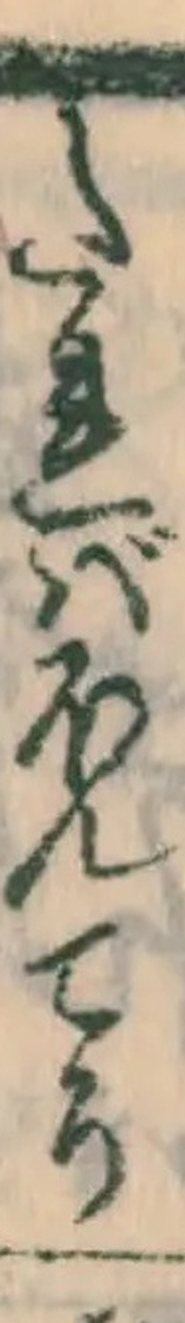たればほんてう
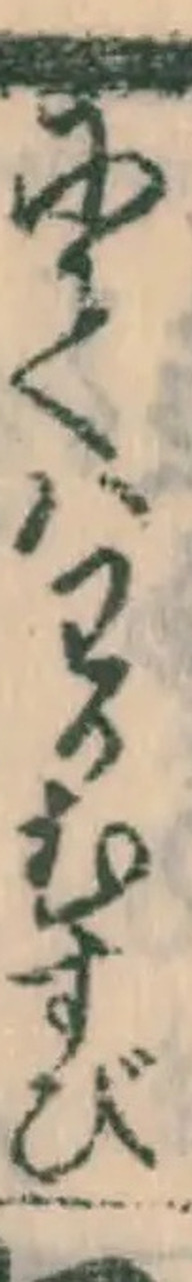にてはわかむすび
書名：養蚕往来
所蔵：国立国会図書館 National Diet Library, JAPAN
